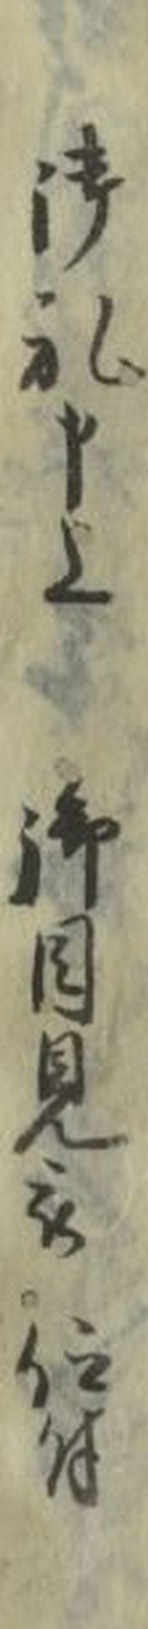御礼申上御目見被仰付
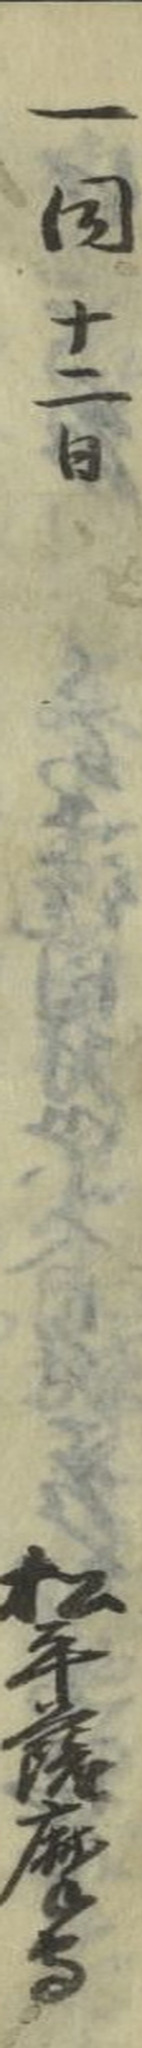一同十二日松平薩摩守
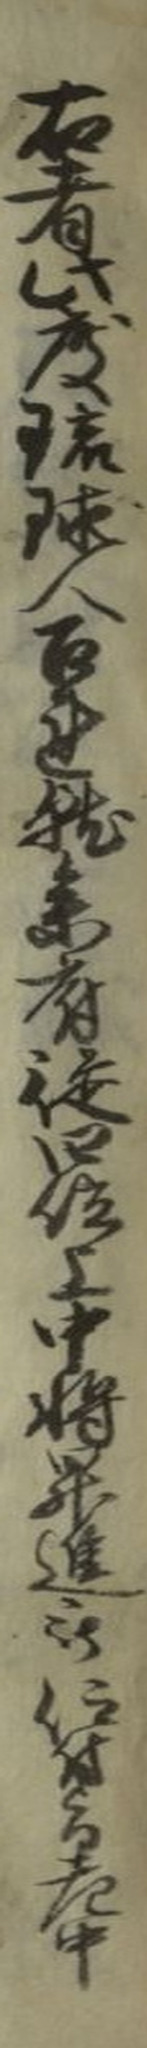右は此度琉球人召連就参府従四位上中将昇進被仰付旨老中
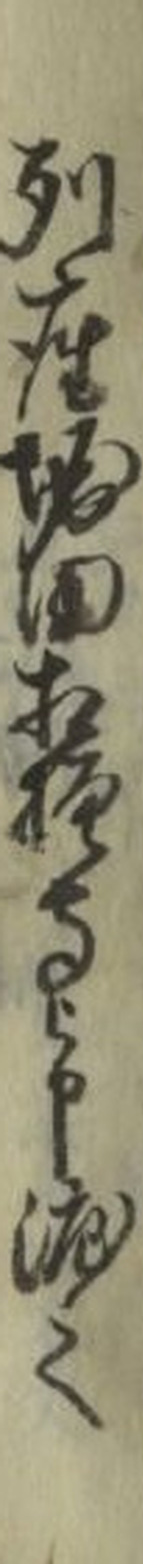列座堀田相模守被申渡也
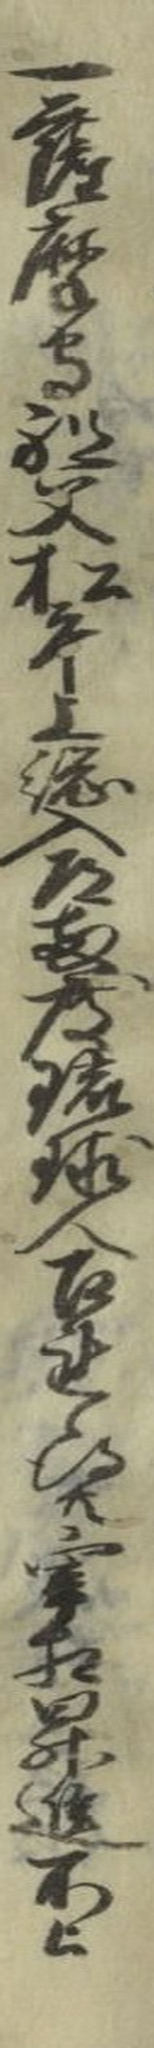一薩摩守祖父松平上総入道両度琉球人召連候得共宰相昇進不被
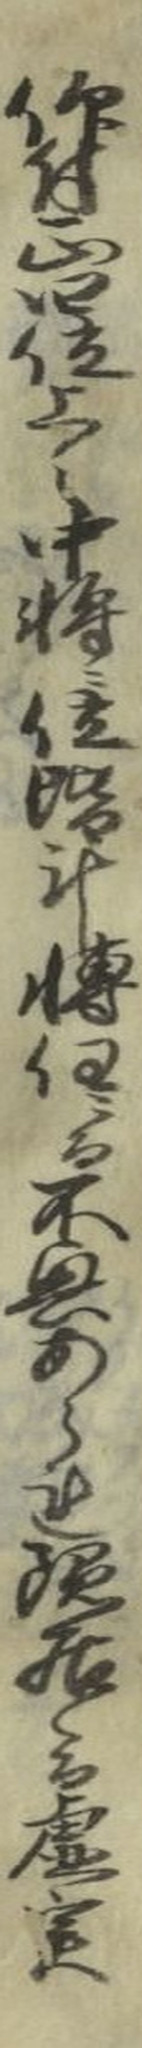仰付正四位上之中将に位階計転任にて不興あられ隠居候て虚実
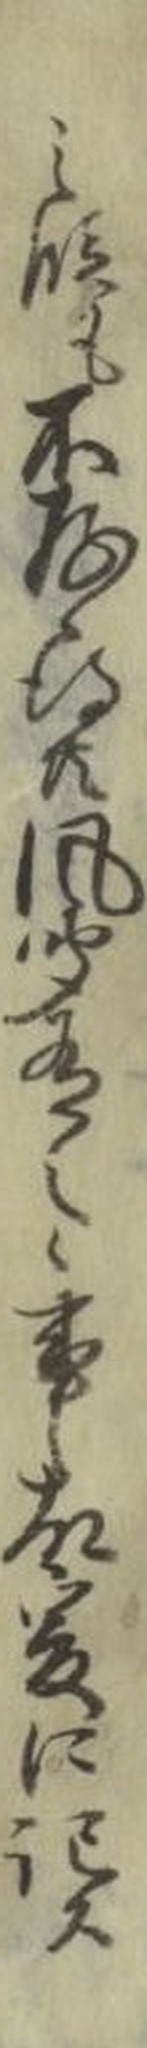之段も不存候得共風聞多し候事故爰に記す
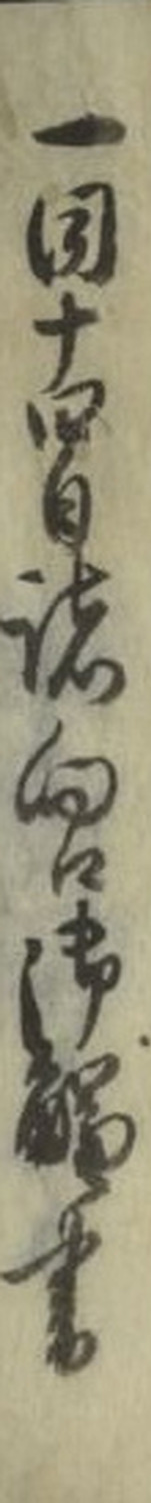一同十四日諸向え御触書
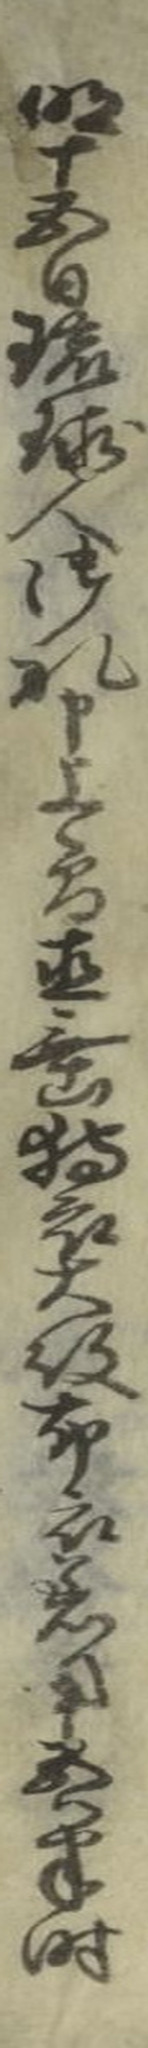明十五日琉球人御礼申上候間直垂狩衣大役布衣着用五ッ半時
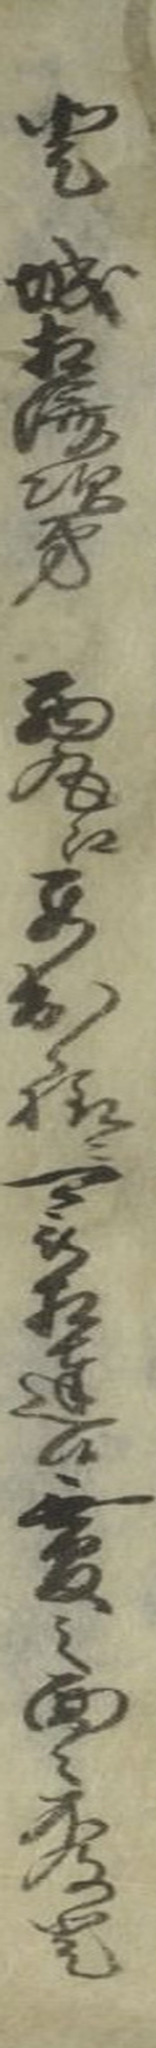登城相済次第西丸え罷出候様に可被相達候無官之面々不及登
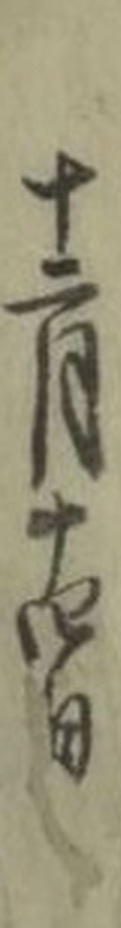十二月十四日
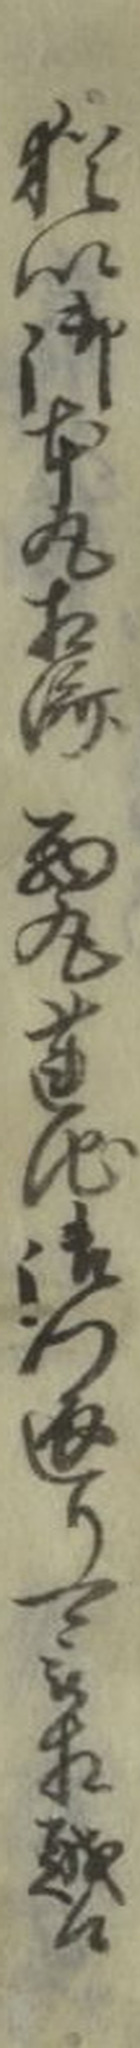猶以御本丸相済西丸蓮池御門通り可被相越候
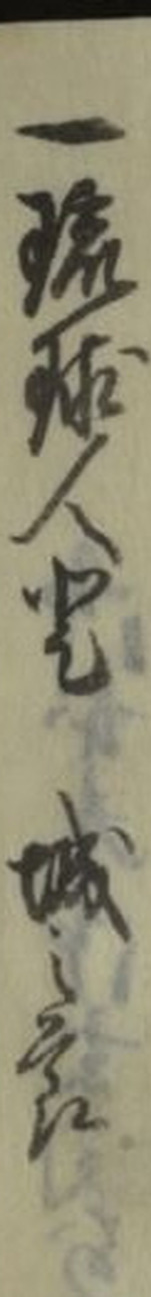一琉球人登城之節

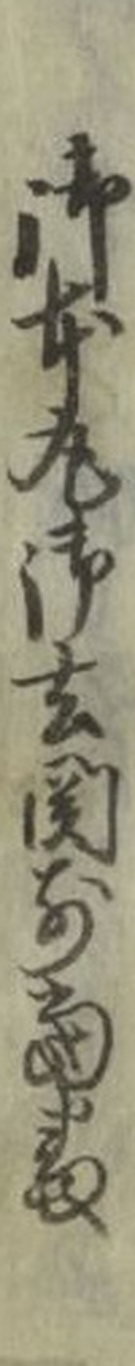御本丸御玄関前当番
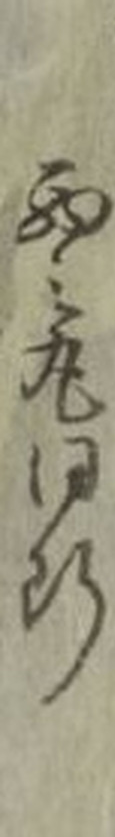西之丸同断
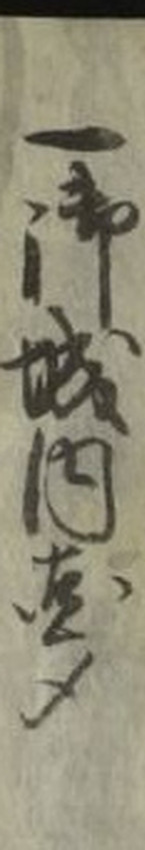一御城内固め
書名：琉球人来朝之記
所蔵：University of the Ryukyus Library
